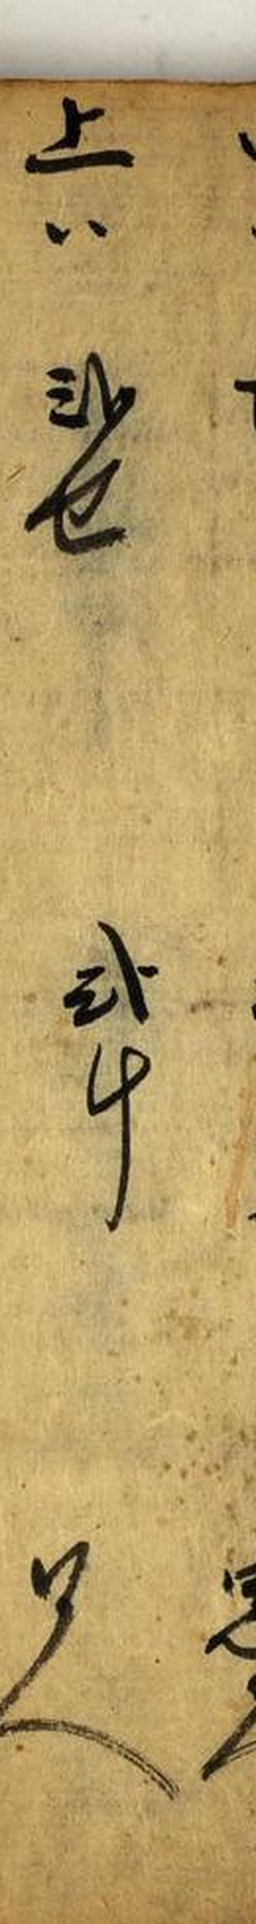上同弐セ弐斗同人
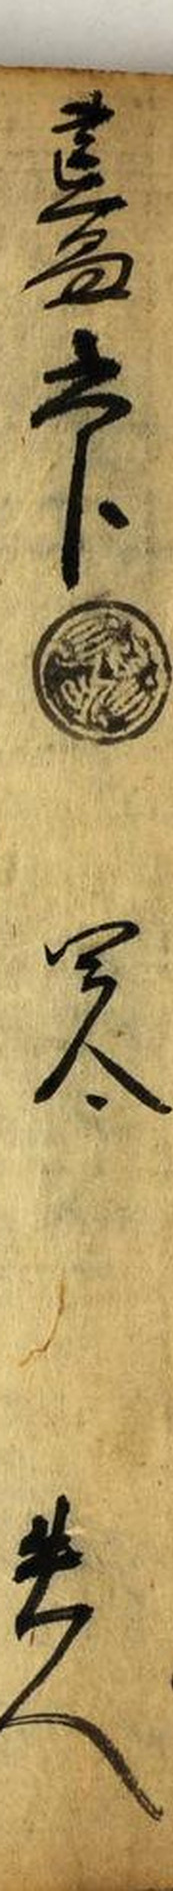荒畠六分㊞四合失人
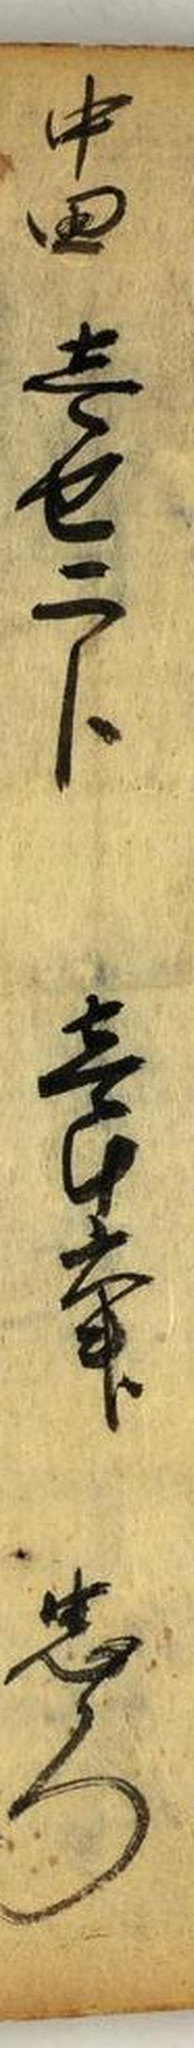中田壱せ二分壱斗六升忠右衛門
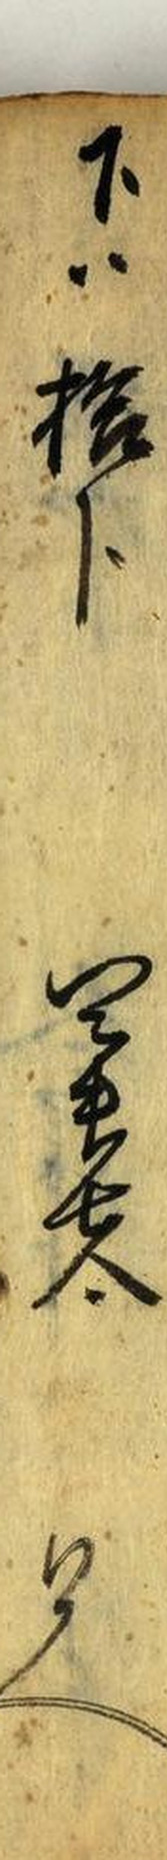下同拾分四升七合同人
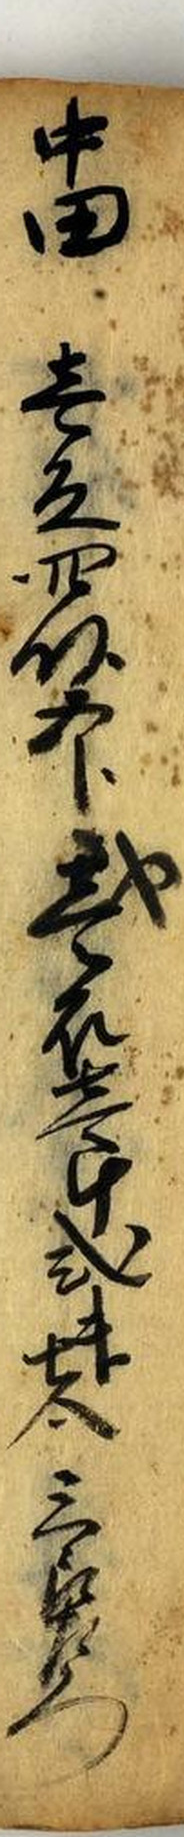中田壱反四畝五分弐石壱斗弐升七合三郎左衛門
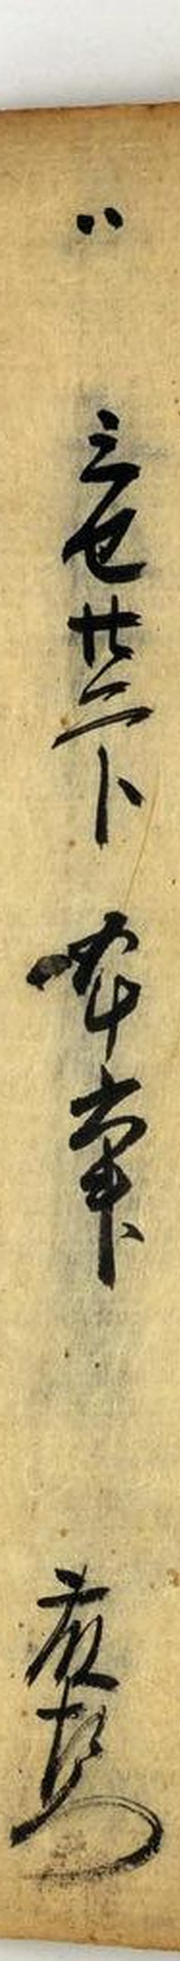同三セ廿二分五斗六升藤左衛門
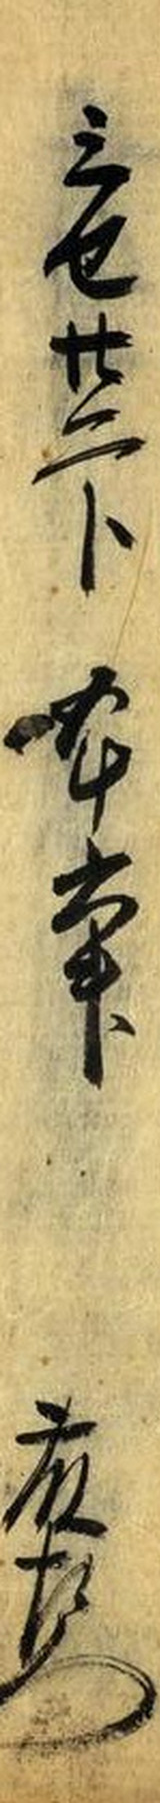同三セ廿二分五斗六升藤左衛門
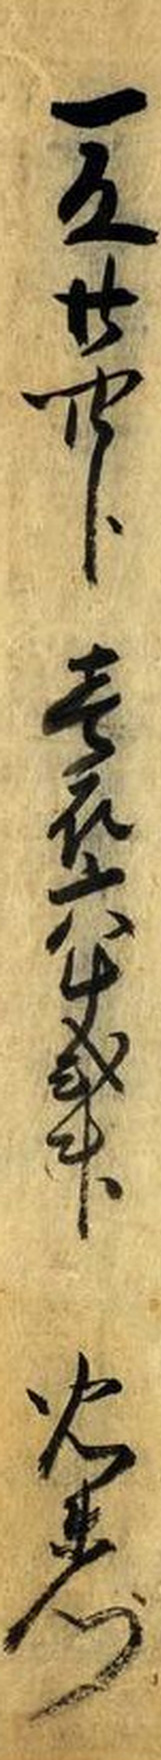同一反廿四分壱石六斗弐升忠右衛門
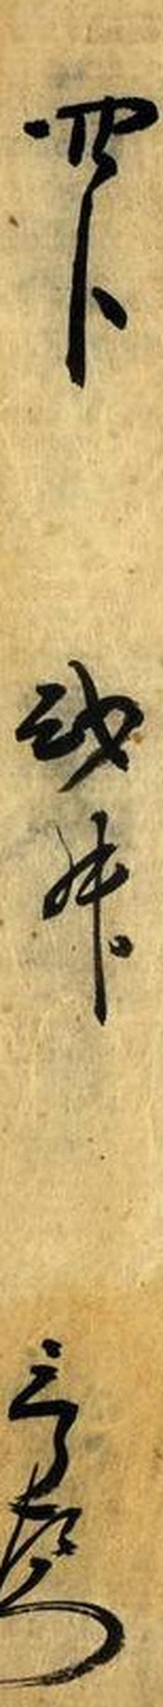同四分弐升三郎左衛門
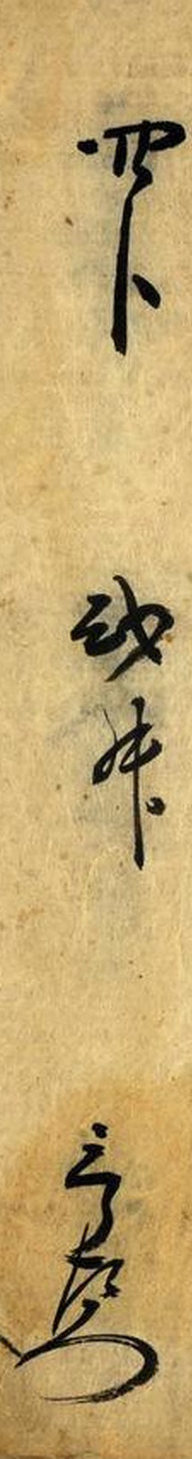同四分弐升三郎左衛門
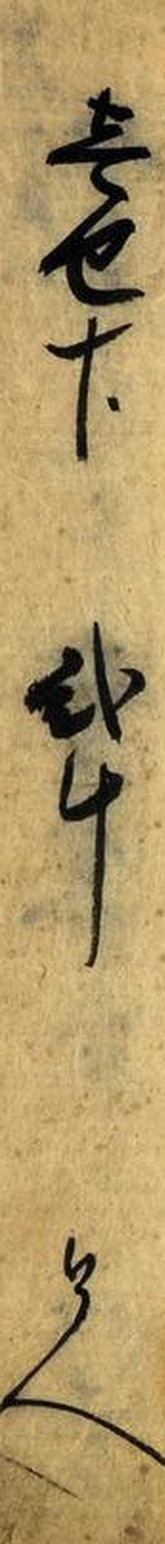同壱セ十分弐斗同人

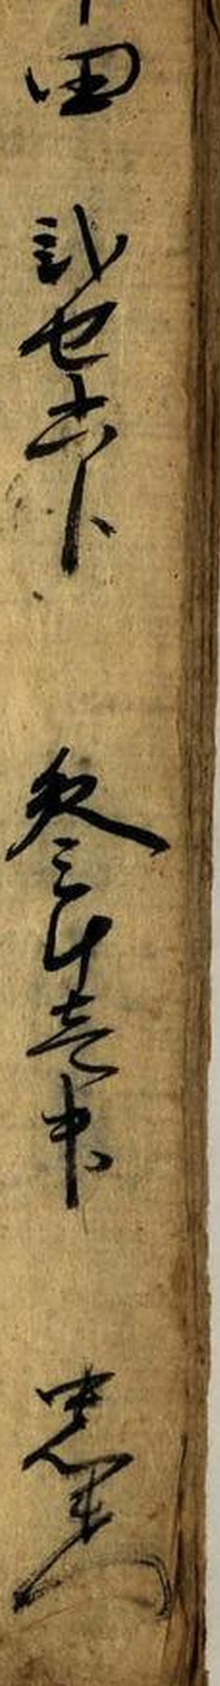下田弐セ六分参斗壱斗忠右衛門
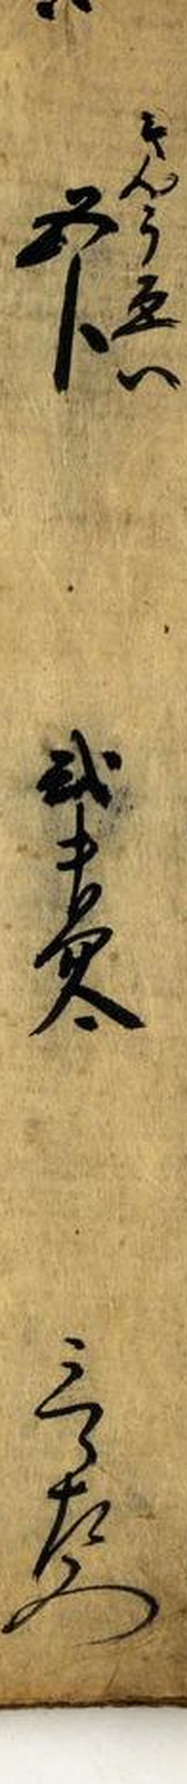同五分弐升四合三郎左衛門
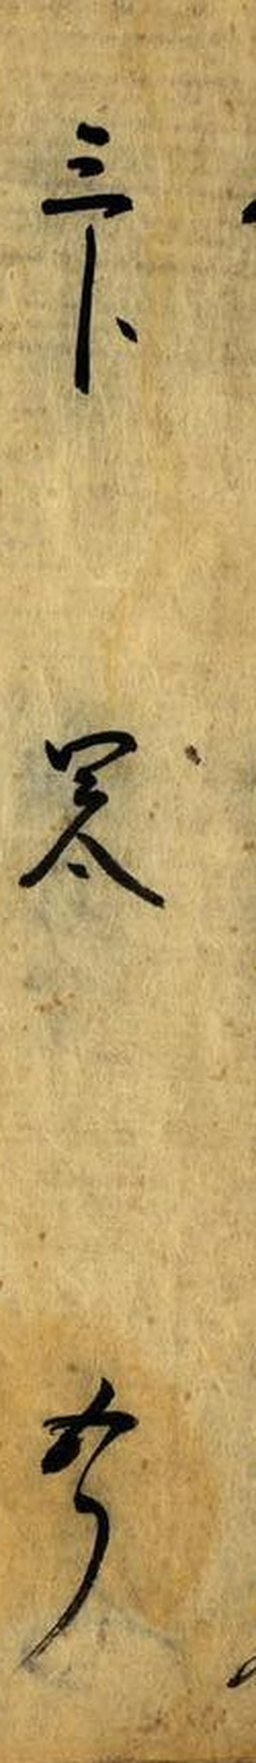同三分四合五郎
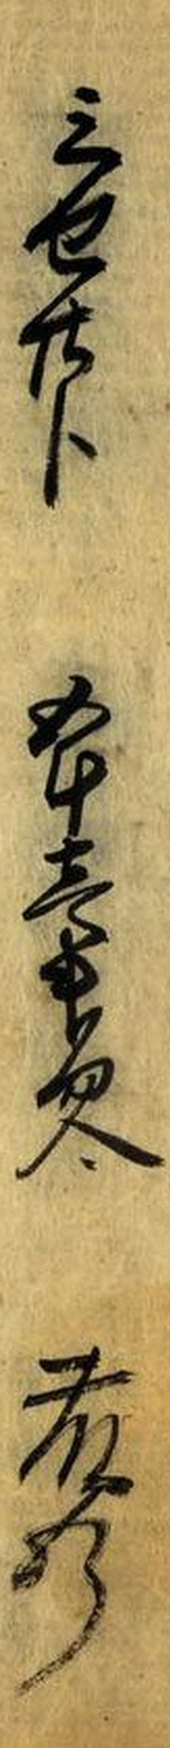同三セ廿分五斗壱升四合藤九郎
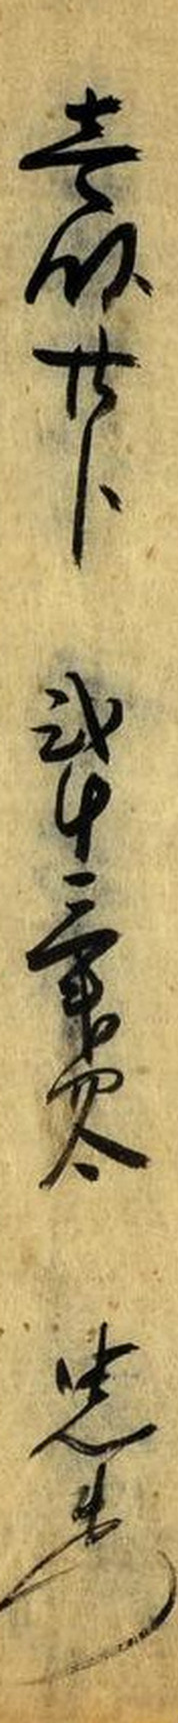同壱畝廿分弐斗三升四合忠右衛門
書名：越前国西方内志津庄内本折村御検地帳
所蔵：福井県文書館 Fukui Prefectural Archives
